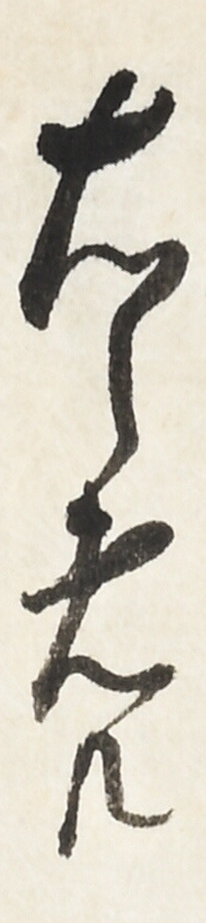右之者共

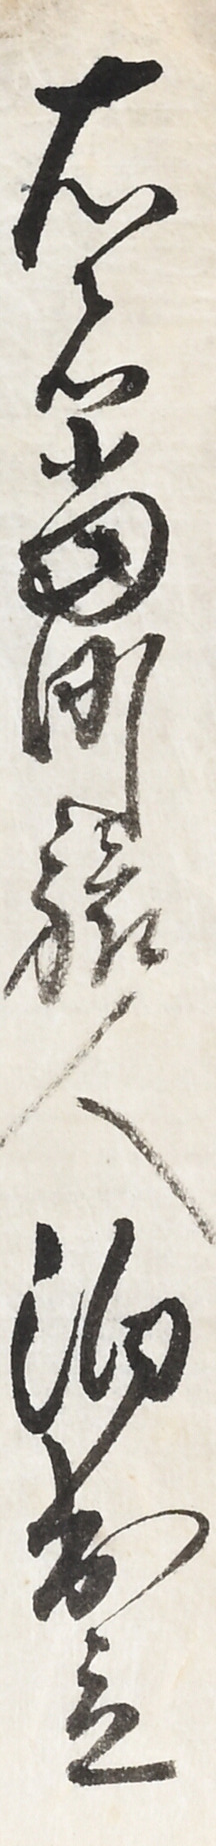右者当町旅人泊出立
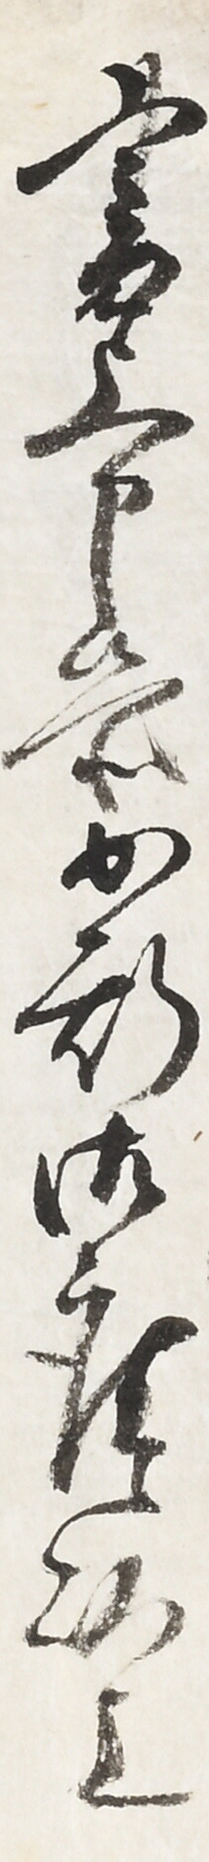書上申候処如斯御座候以上
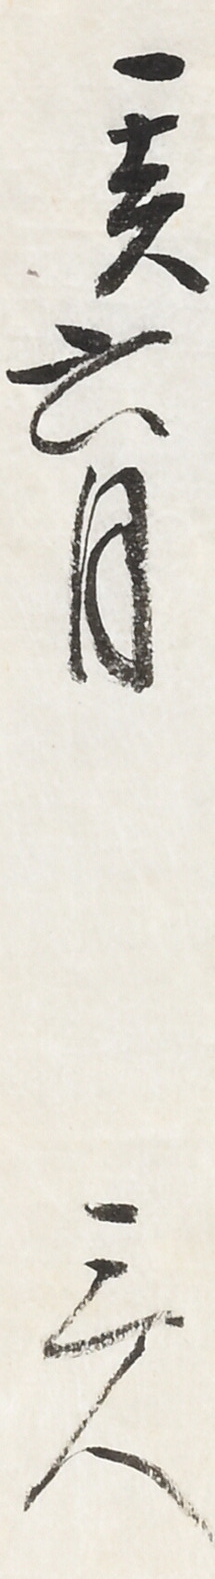亥六月三人
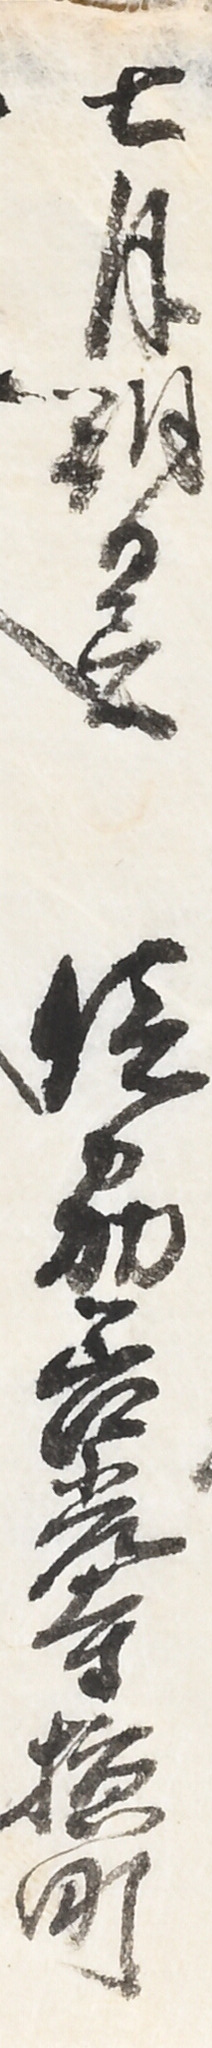七月朔日着信州善光寺横町
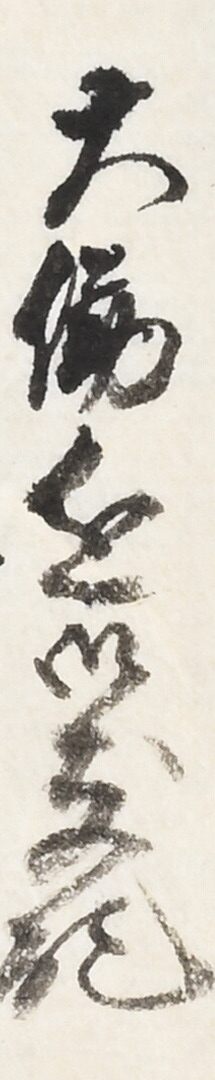大働近御支配
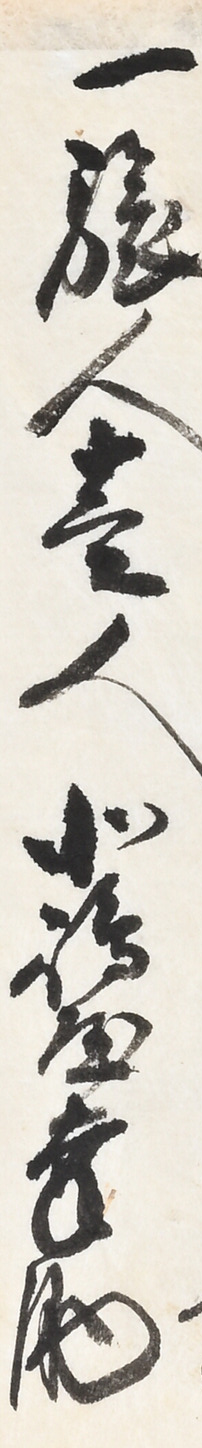一旅人壱人北嶋屋幸助
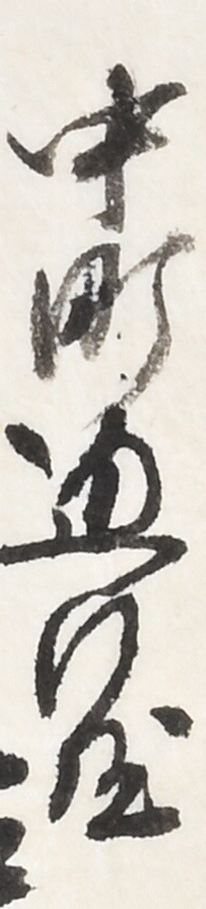中町近江屋
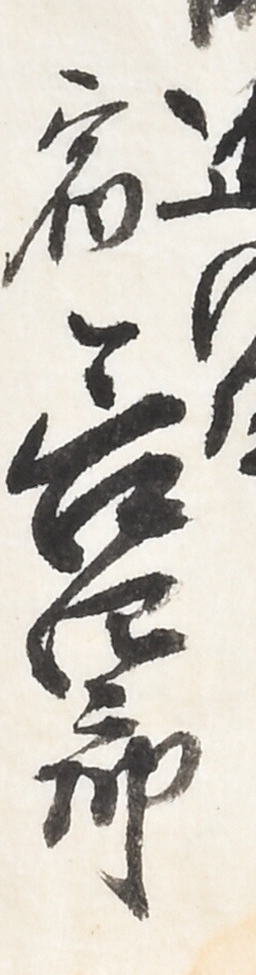宿善四郎
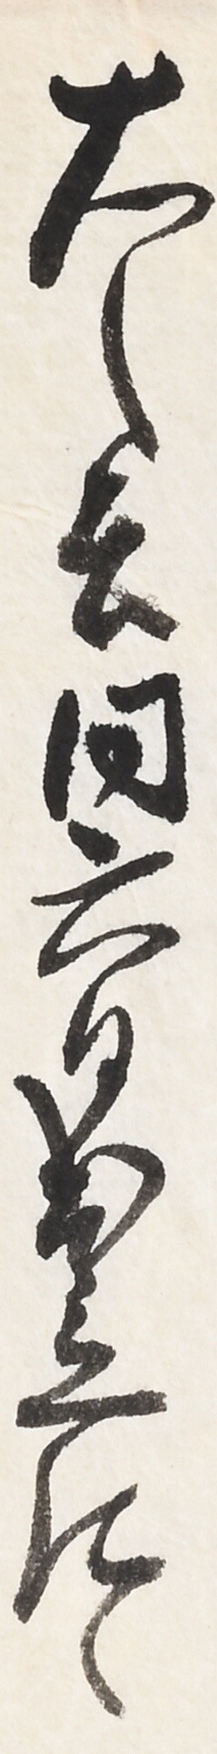右之者同六日出立仕候
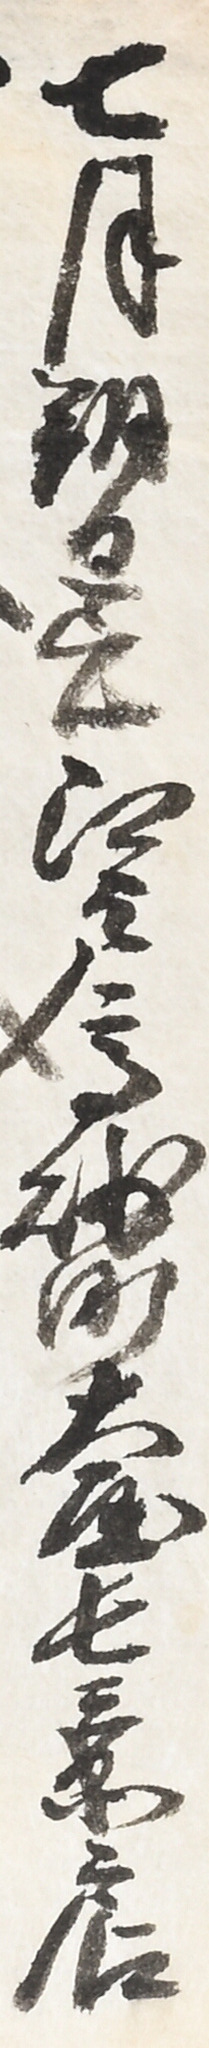七月朔日着江戸高砂町大屋七兵衛店
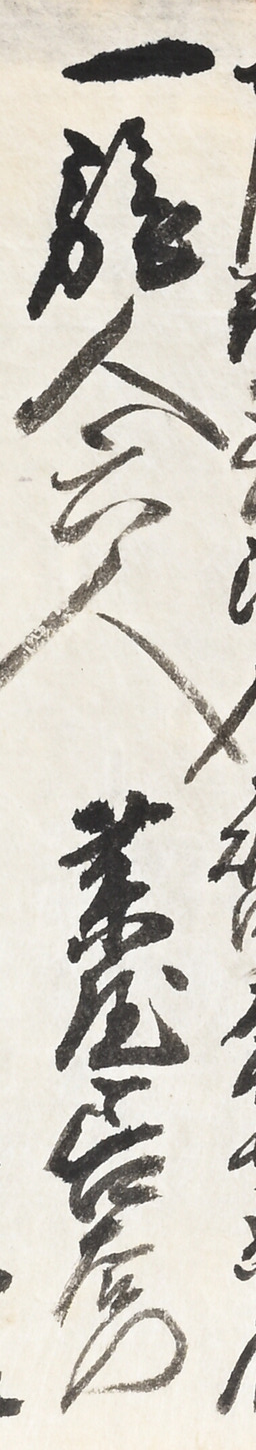一旅人六人茶屋善右衛門
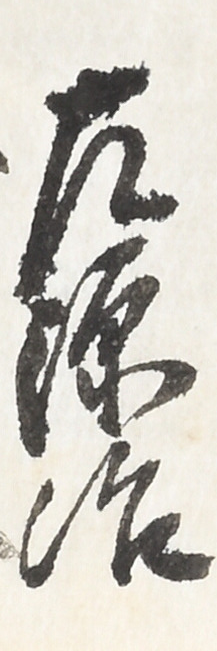左源治
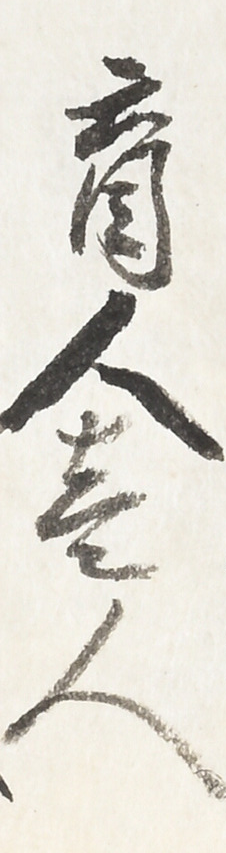育人壱人
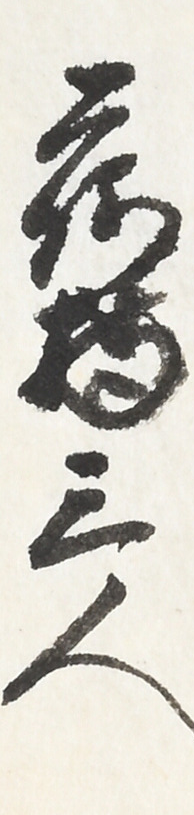荷持三人
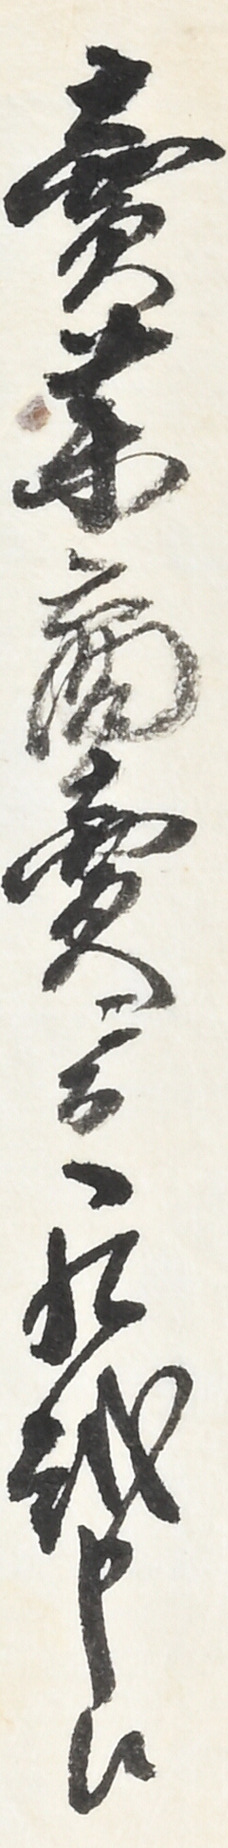売茶商売ニ而罷越申候
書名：旅人泊控帳
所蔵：伊那市立高遠町図書館・合同会社AMANE
